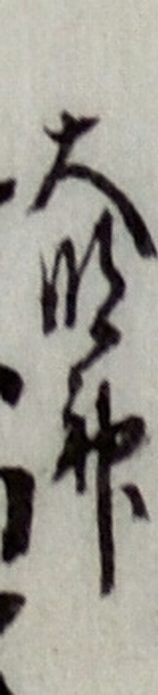大明神
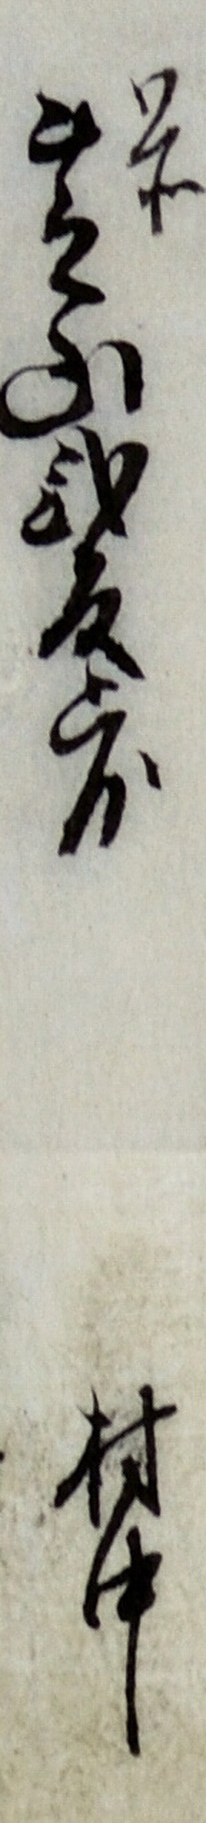芝山弐反歩村中

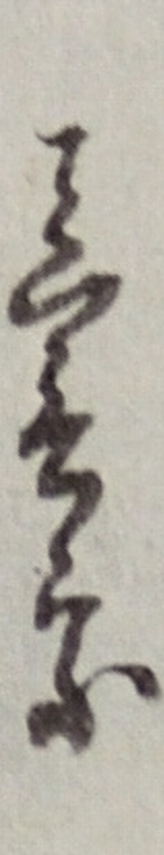真言宗
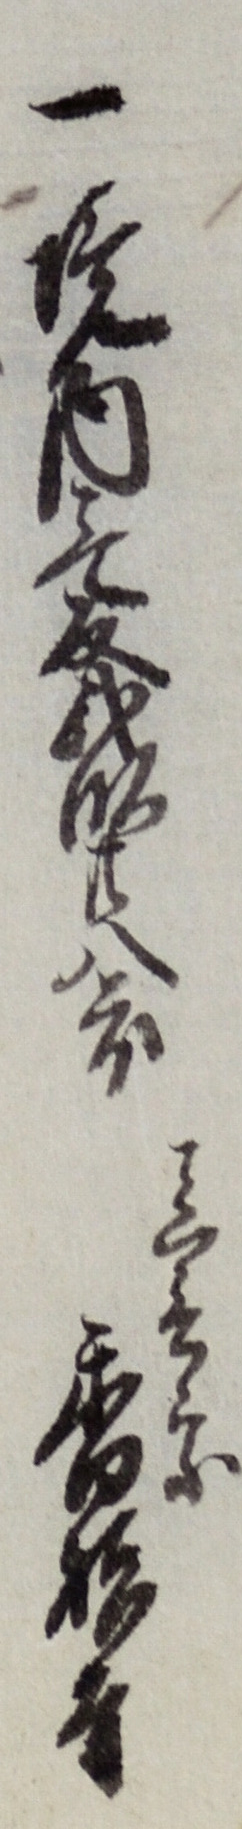一境内壱反弐畝廿八歩香福寺
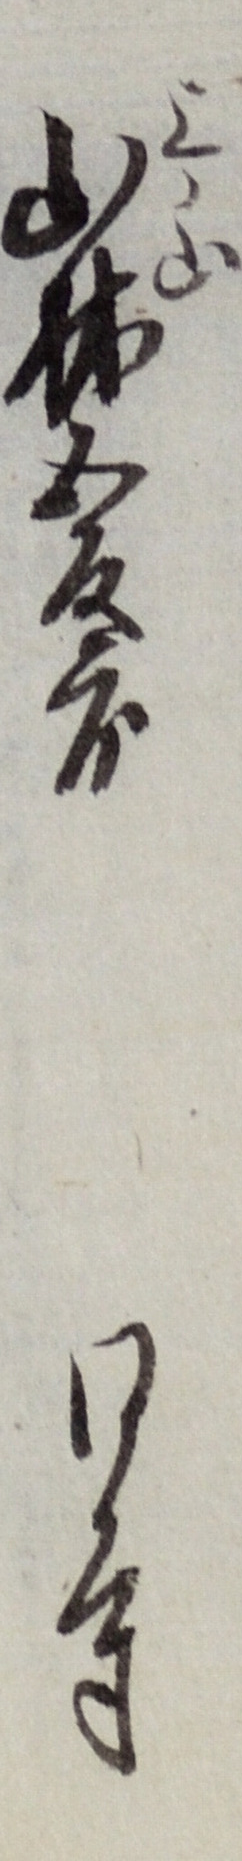山林五反歩同寺
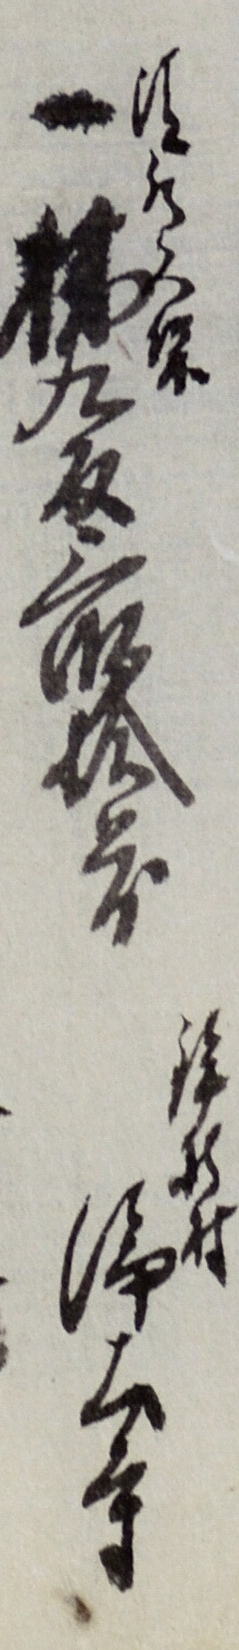一林九反三畝拾歩浄土寺
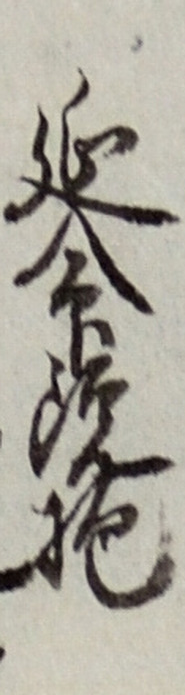延命院抱
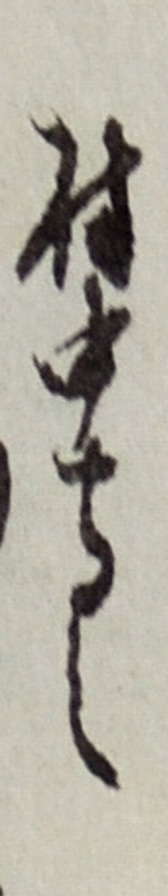村中守之
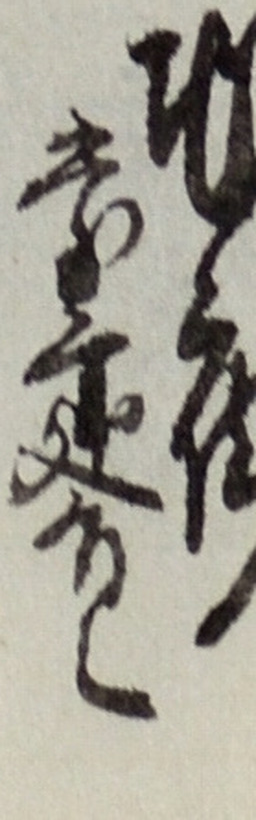堂建有之
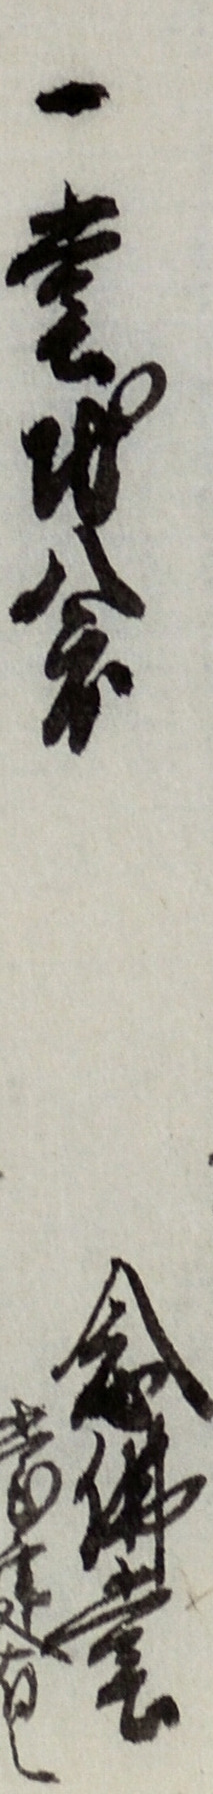一堂地八歩念仏堂
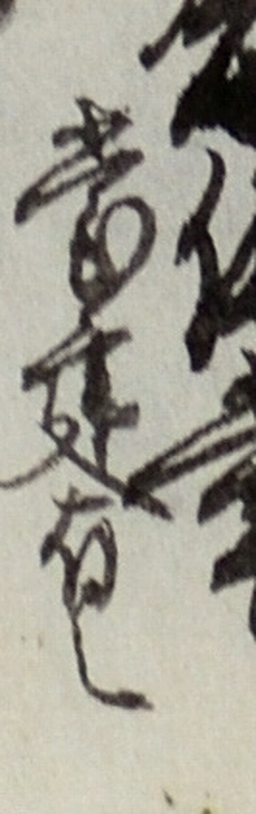堂建有之
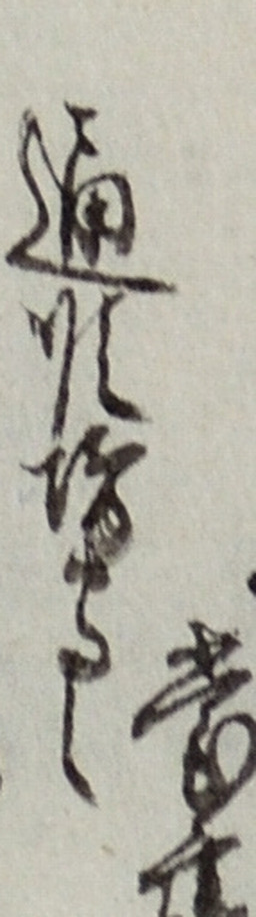通順坊守之
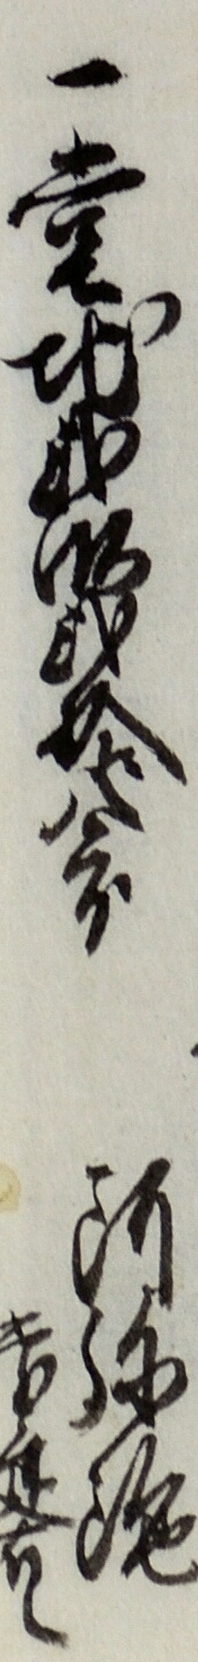一堂地弐畝弐拾八歩阿弥陀
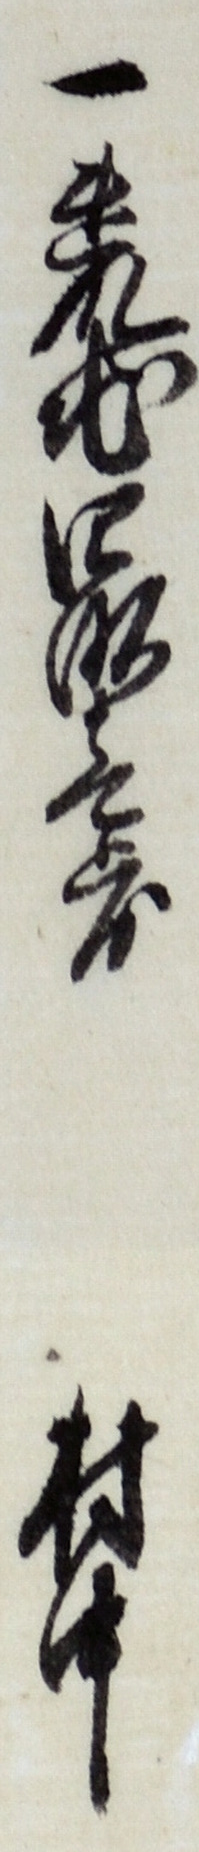一荒地四畝壱歩村中
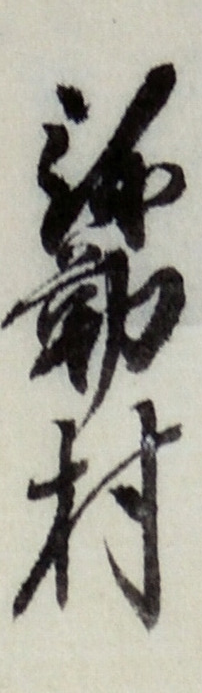弥勒村
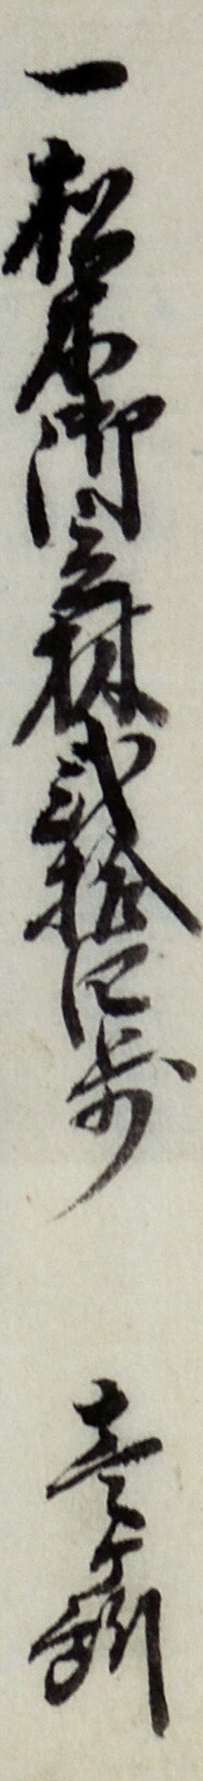一松木御立林弐拾四歩壱ヶ所
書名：御領分中山林社地手控
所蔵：伊那市立高遠町図書館・合同会社AMANE
